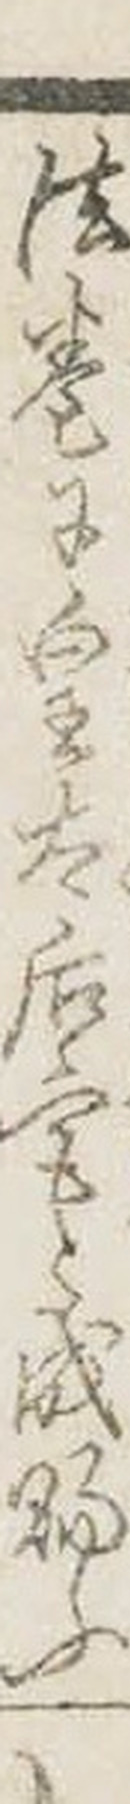法巻に皇太后宮と成賜ふ
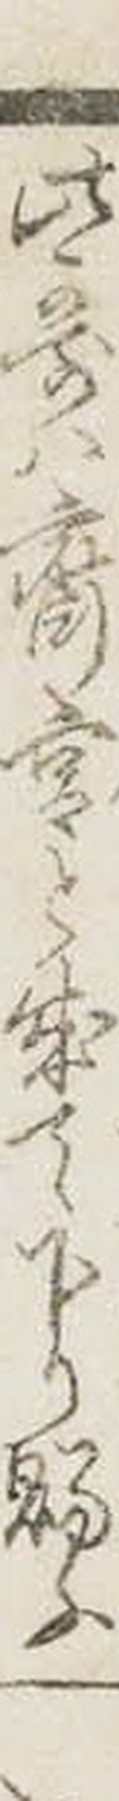此哥は斎宮と成て下り賜ふ
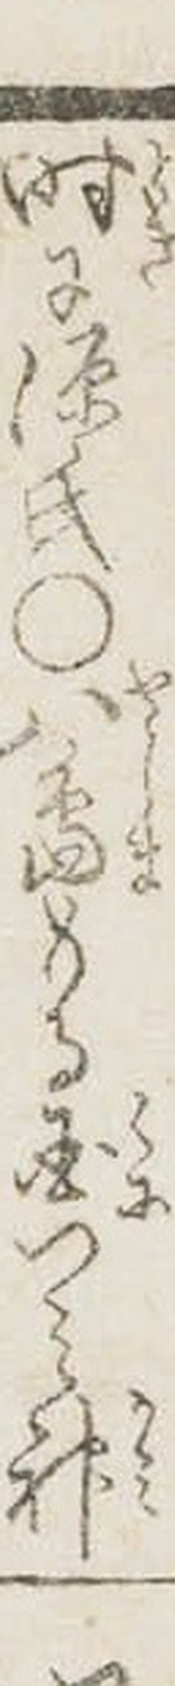時に源氏○八島もる国つみ神
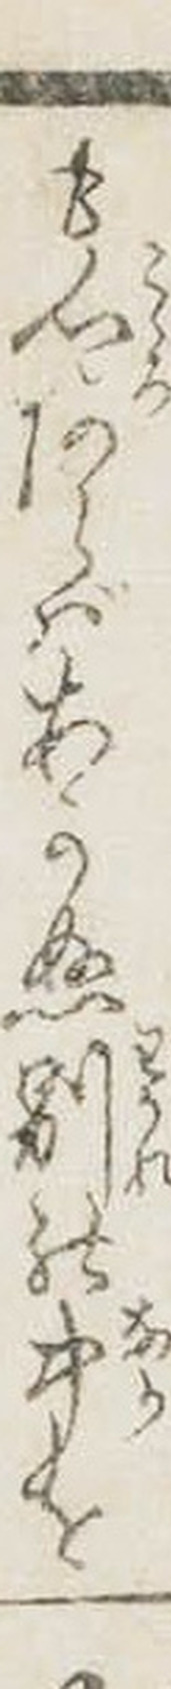も心あらばあかぬ別の中を
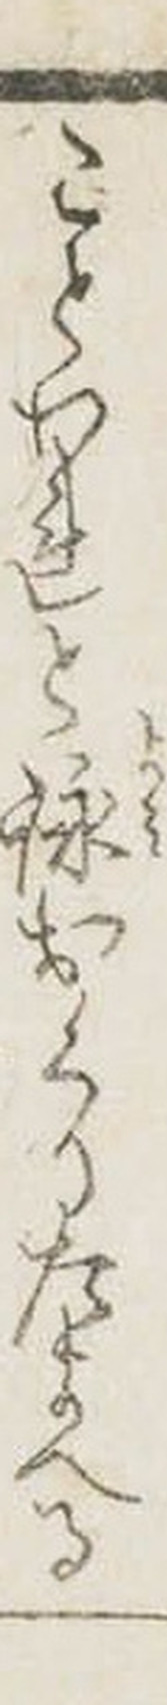ことわれと詠おくりたまへる
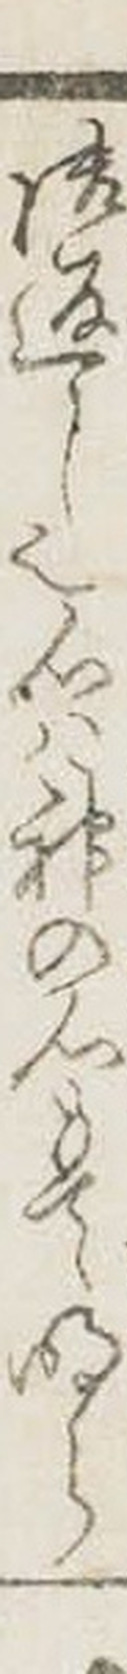御返し也心は神の心もて明ら
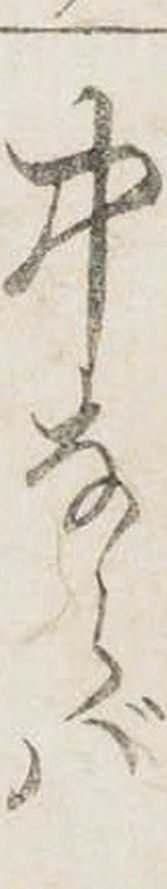中ならば
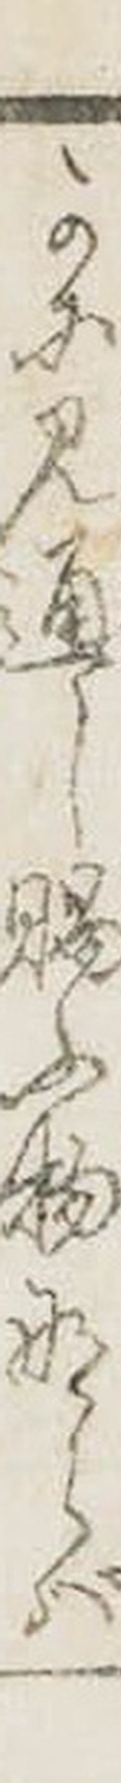かに見通し賜ふ物ならば
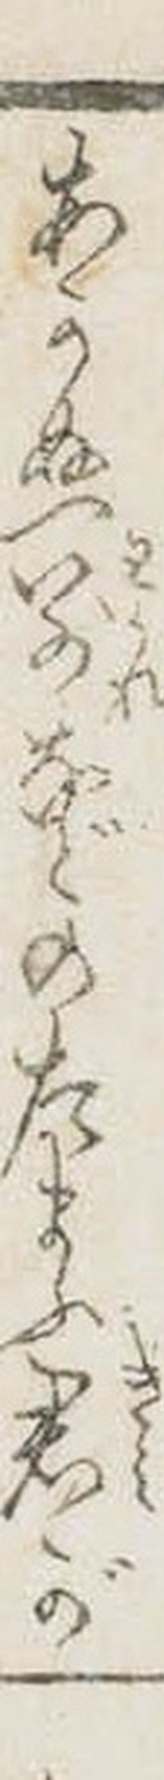あかぬ別などのたまふ君が
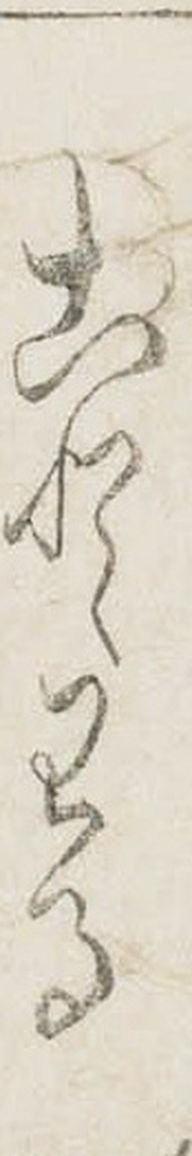ことわる
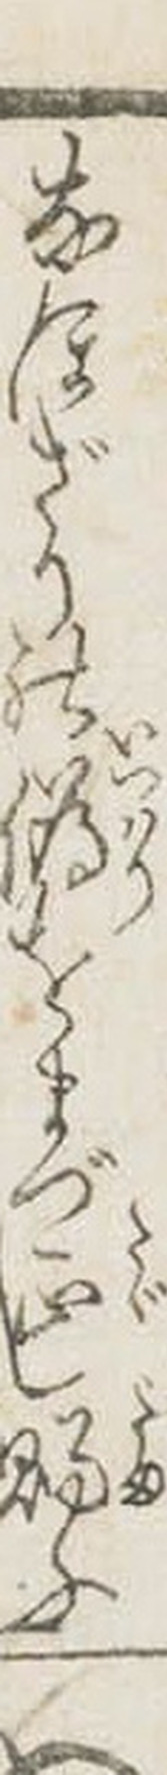なほざりの偽をまづ正し賜ふ
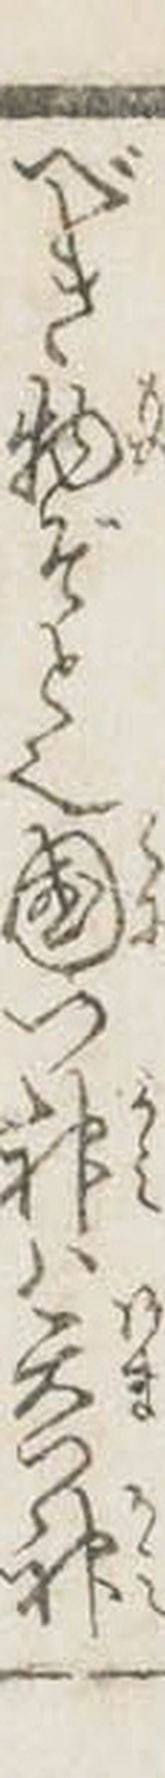べき物ぞと也国つ神は天つ神
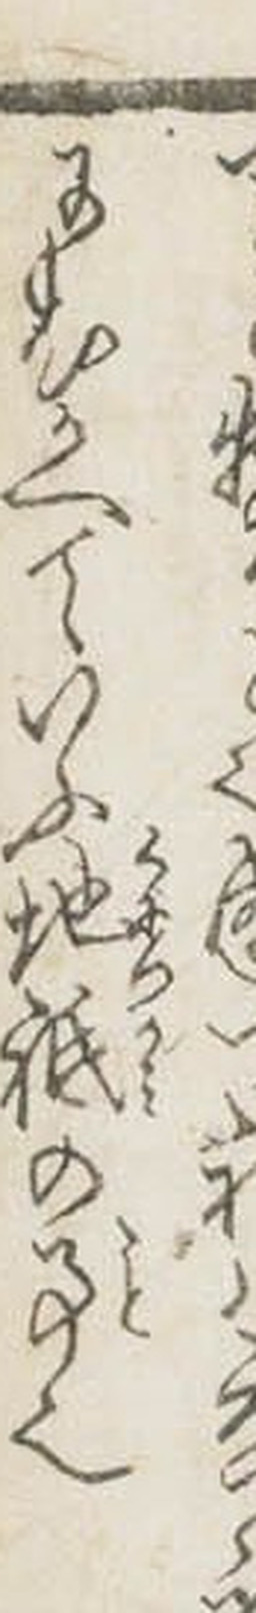にむかへていふ地祇の事也
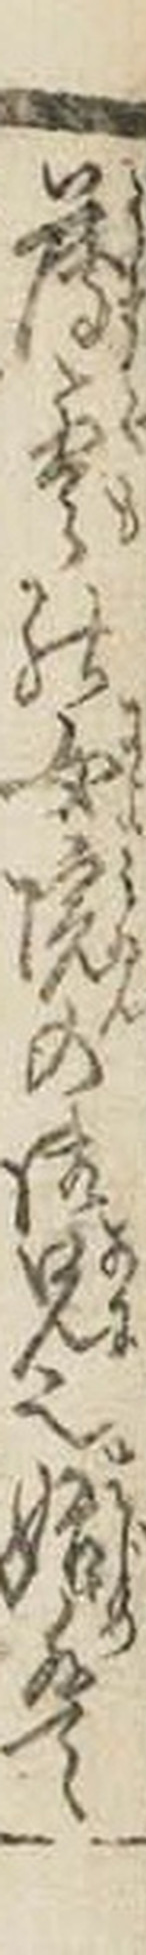薄雲の女院の御兄也始は
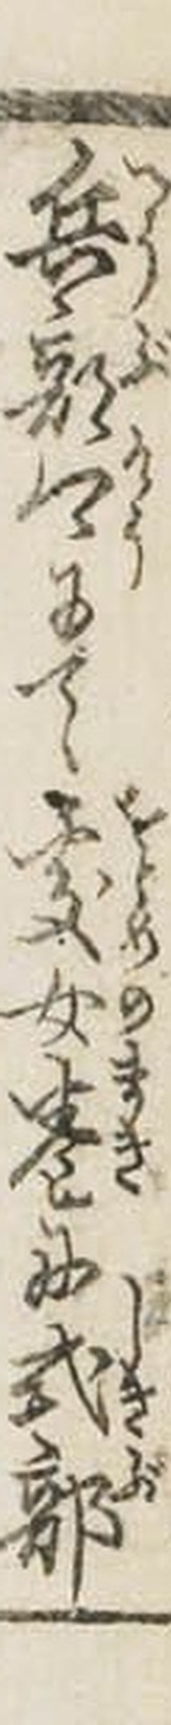兵部卿にて処女巻に式部
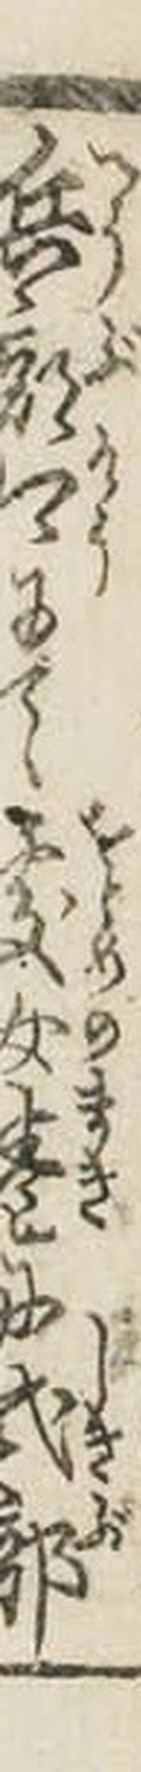兵部卿にて処女巻に式部
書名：源氏百人一首
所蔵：東京学芸大学教育コンテンツアーカイブ
